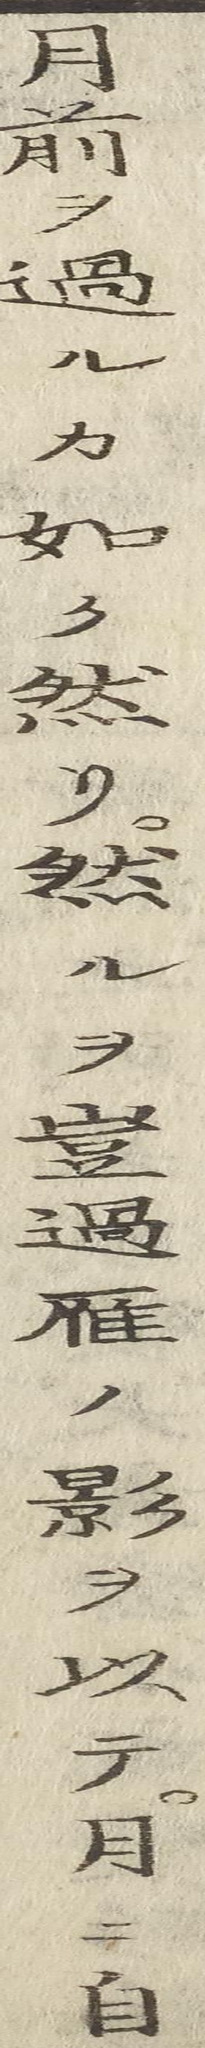月前ヲ過ルカ如ク然リ。然ルヲ豈過雁ノ影ヲ以テ。月ニ自

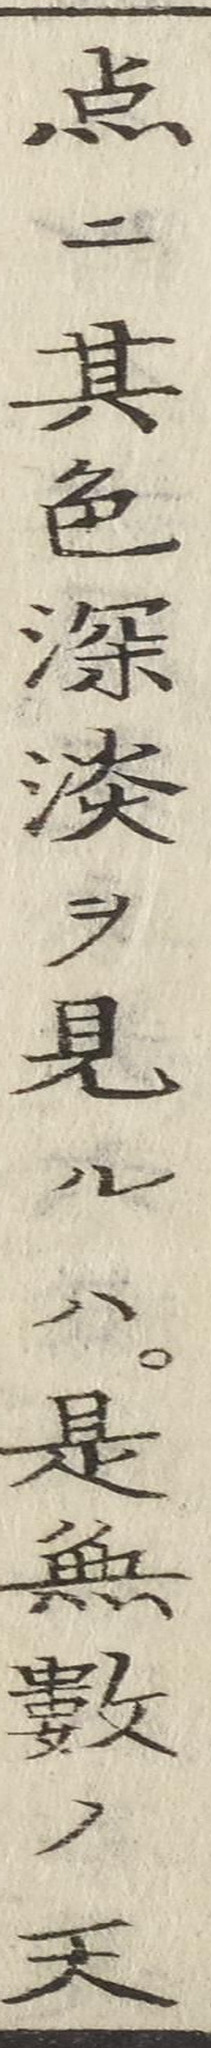点ニ其色深淡ヲ見ルハ。是無数ノ天
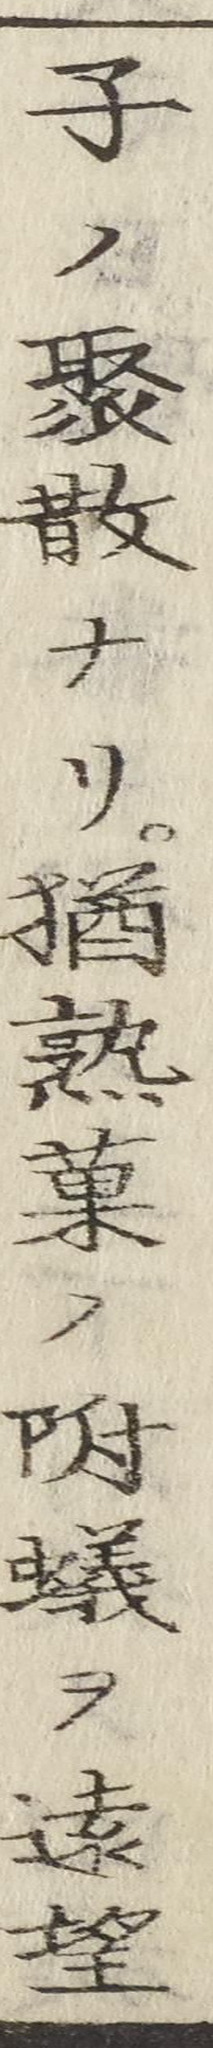子ノ聚散ナリ。猶熟菓ノ附蟻ヲ遠望
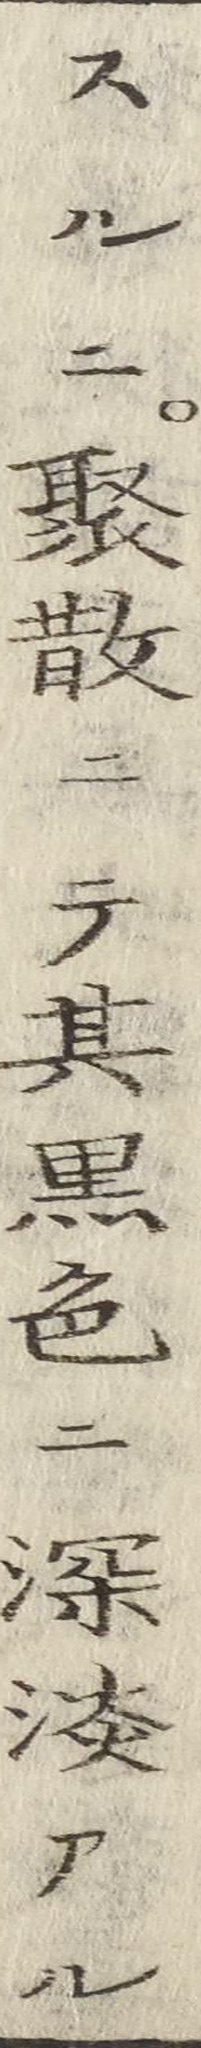スルニ。聚散ニテ其黒色ニ深淡アル
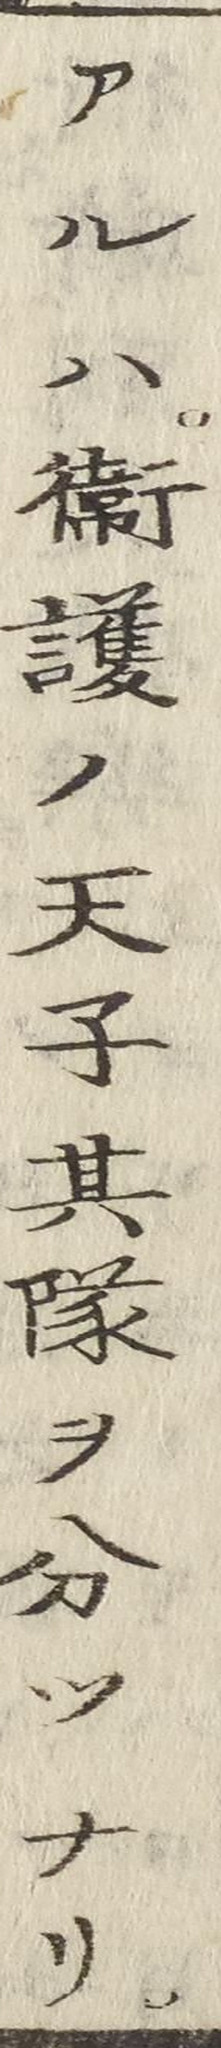アルハ。衞護ノ天子其隊ヲ分ツナリ。
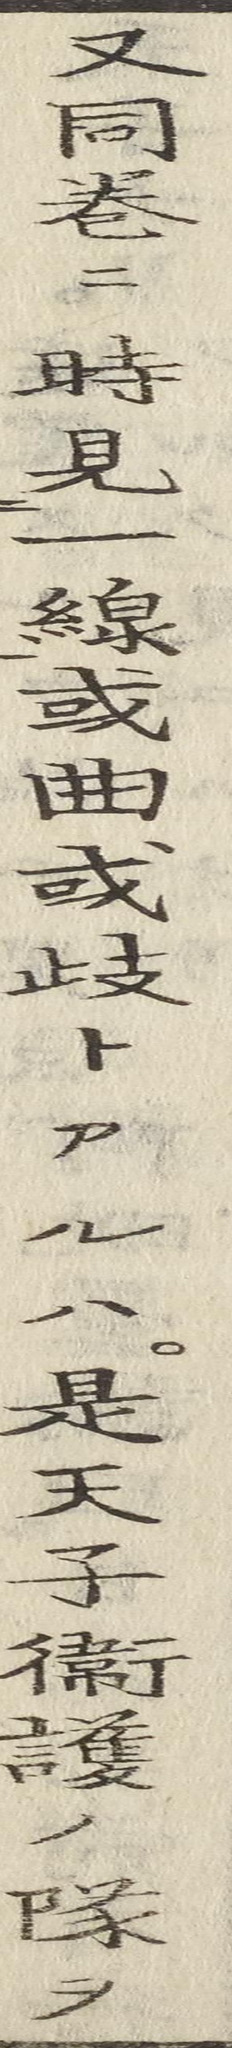又同巻ニ時見ニ一線或曲或歧トアルハ。是天子衞護ノ隊ヲ
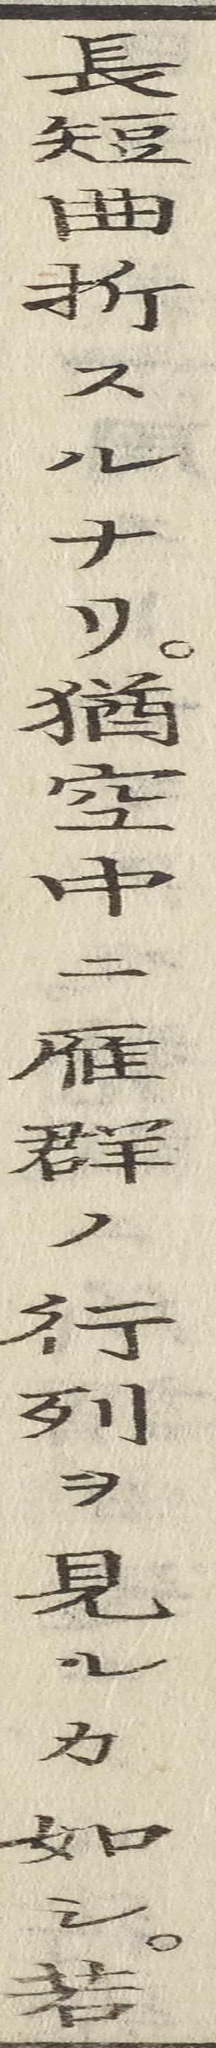長短曲折スルナリ。猶空中ニ雁群ノ行列ヲ見ルカ如シ。若
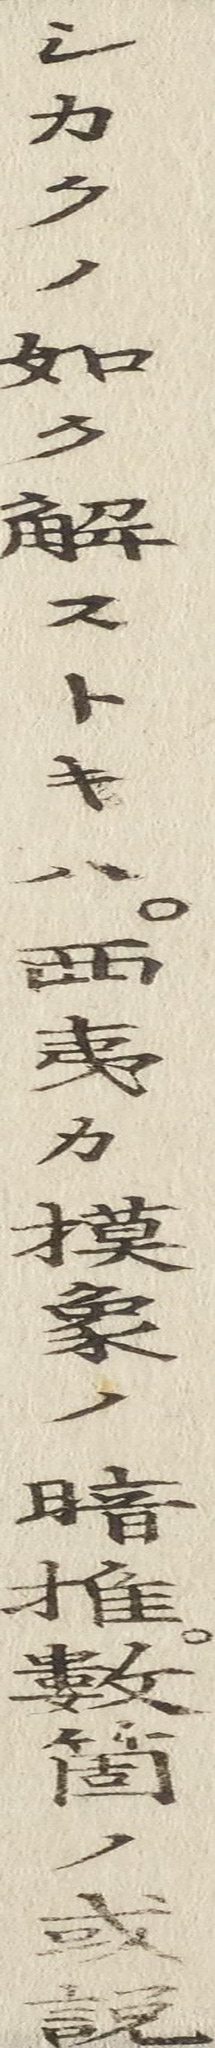シカクノ如ク解ストキハ。西夷カ模象ノ暗推。数箇ノ或説
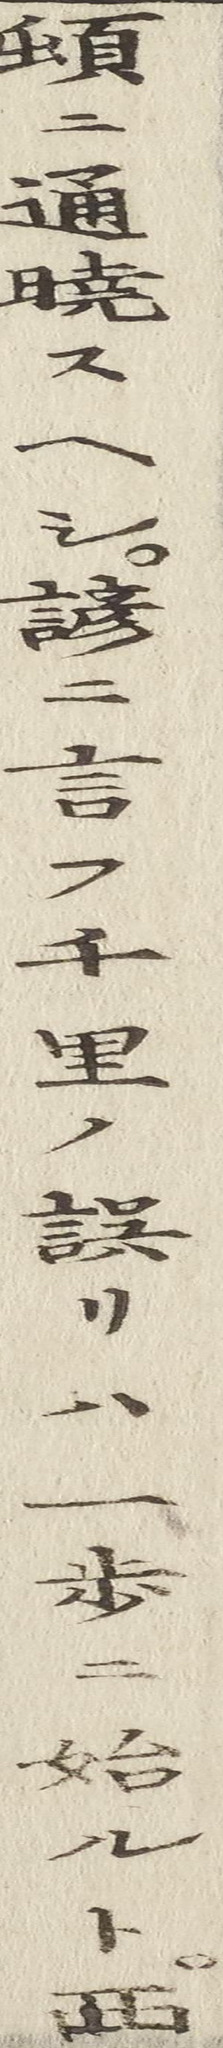頓ニ通暁スヘシ。諺ニ言フ千里ノ誤リハ一歩ニ始ルト。西
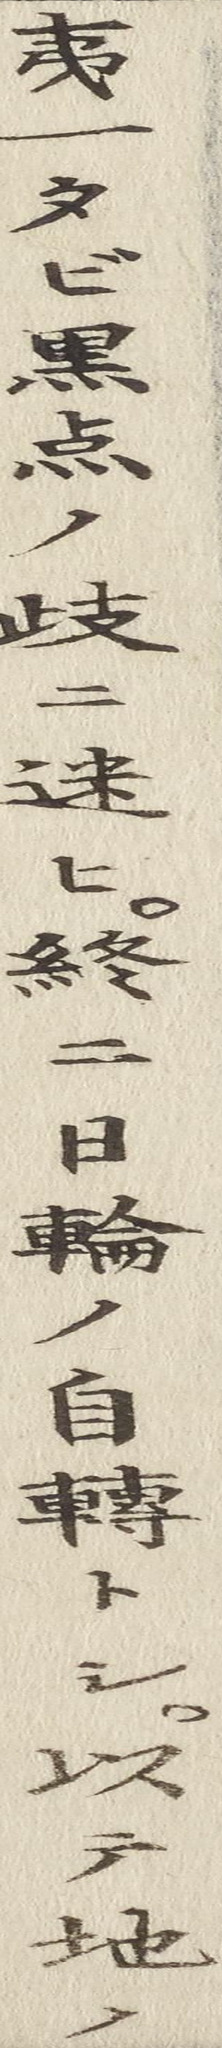夷一タビ黒点ノ歧ニ迷ヒ。終ニ日輪ノ自転トシ。以テ地ノ
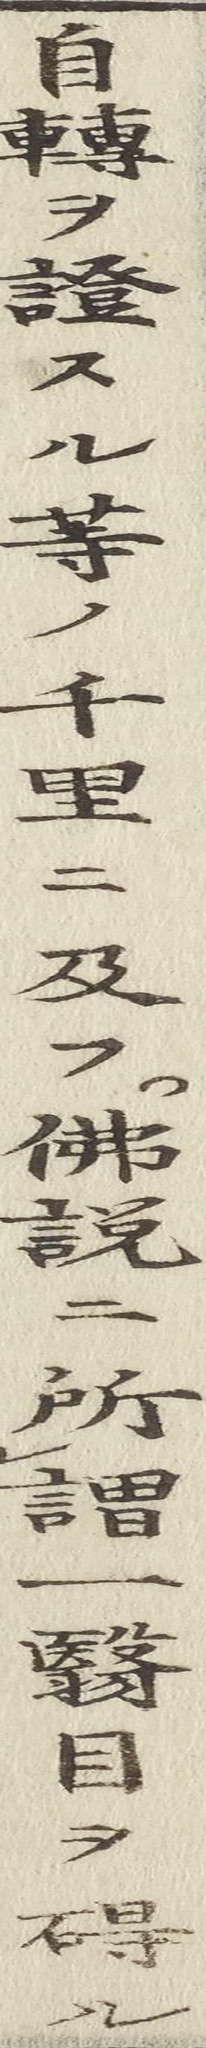自転ヲ証スル等ノ千里ニ及フ。仏説ニ所謂一翳目ヲ碍ル
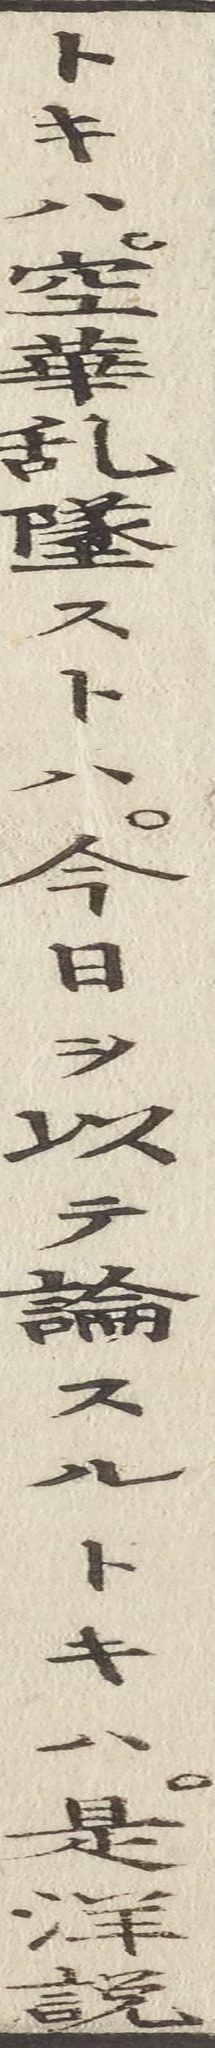トキハ。空華乱墜ストハ。今日ヲ以テ論スルトキハ。是洋説
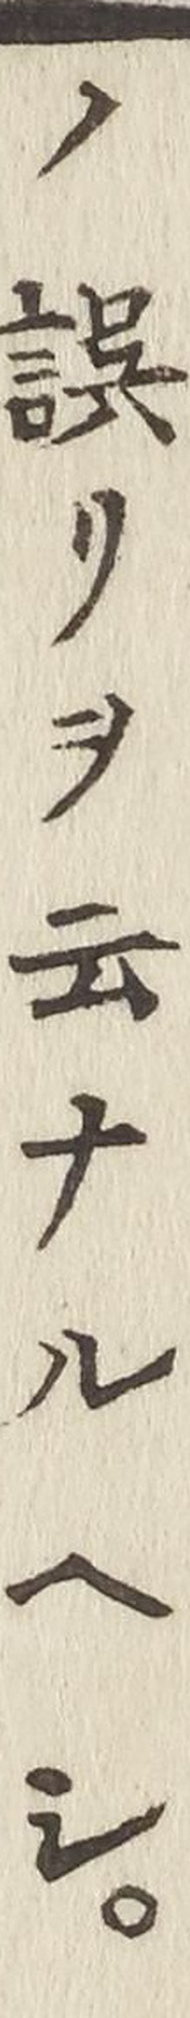ノ誤リヲ云ナルヘシ。
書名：護法新論　二編　中
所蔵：東京大学地震研究所図書室 Earthquake Research Institute Library, The University of Tokyo, JAPAN
